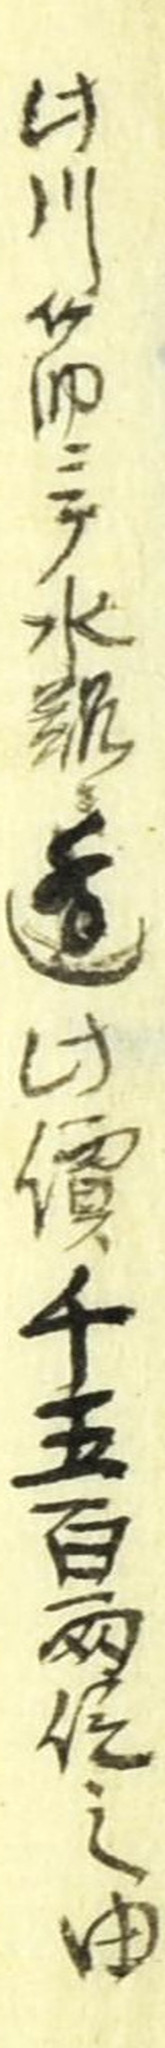此川筋ニテ水難ニ逢此価千五百両位之由
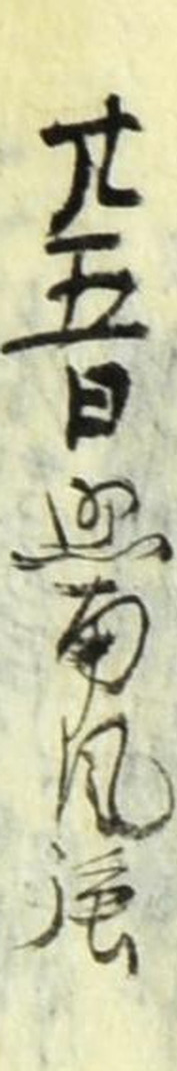廿二日照南風烈

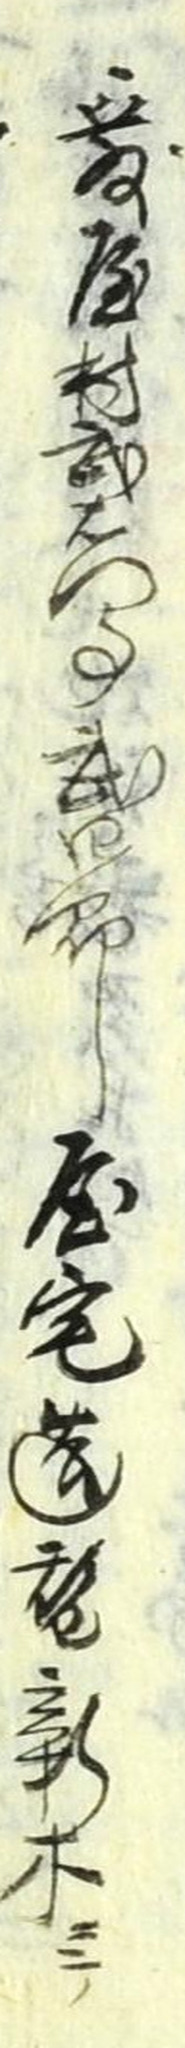舞屋村武右衛門事武四郎屋宅造替新木ニテ
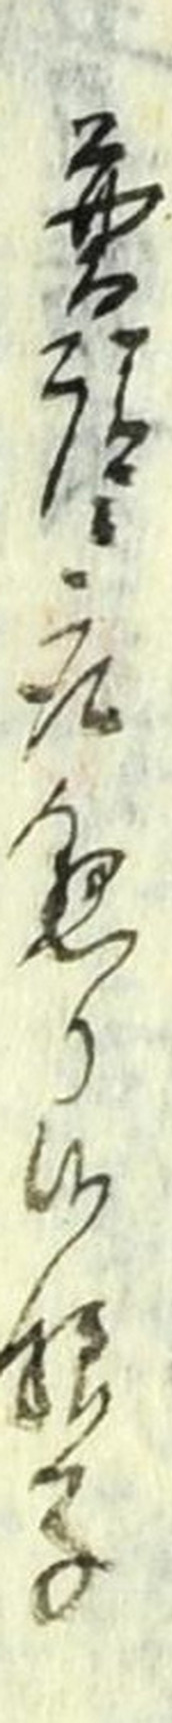普請ニ取懸リ候様子
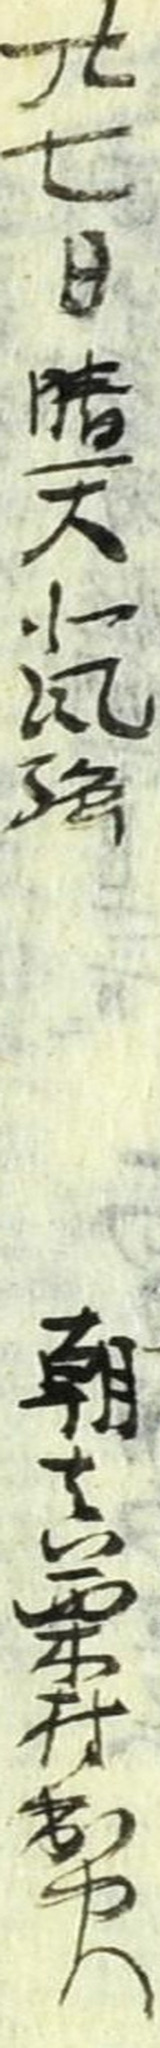廿七日晴天北風強朝真栗村出火
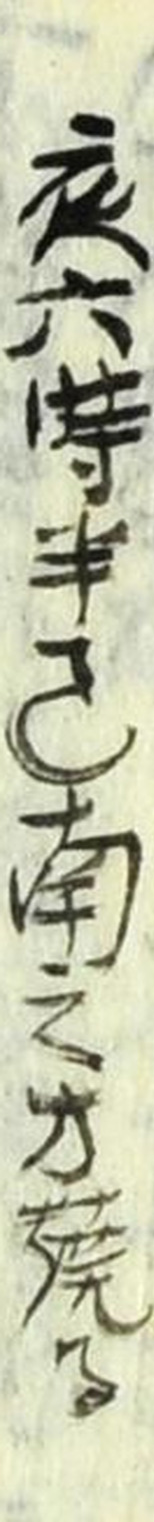夜六時半過南之方焼る
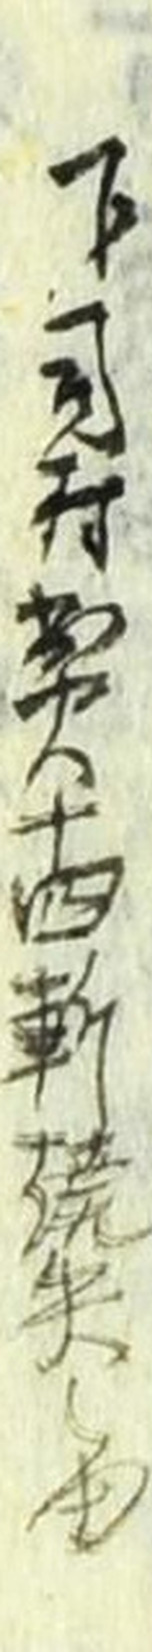下司村出火十四軒焼失之候由
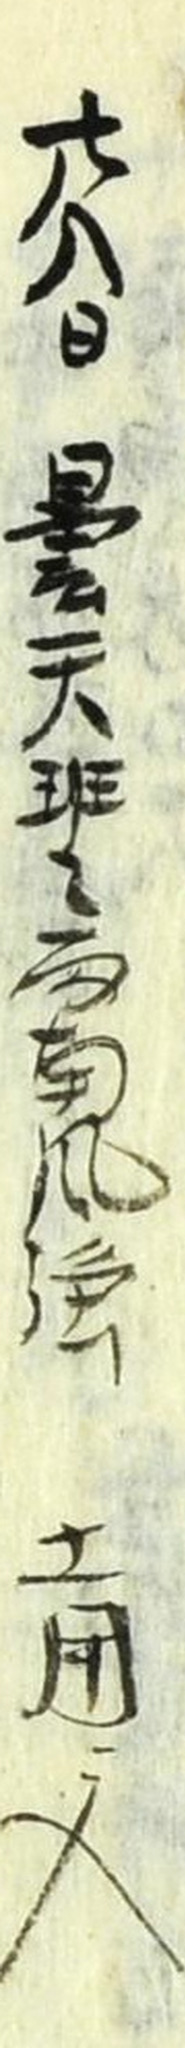廿八日曇天班々雨南風強土用ニ入
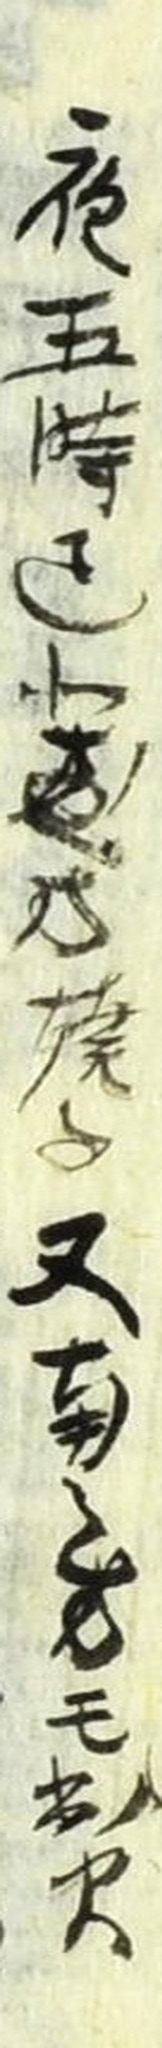夜五時過北ノ方焼る又南之方モ出火
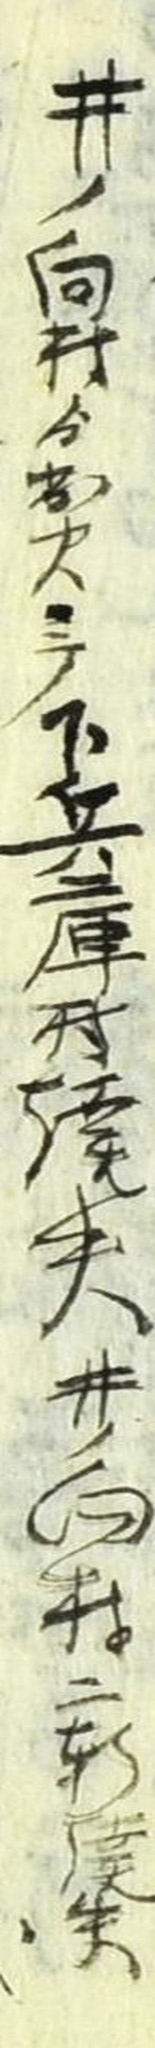井ノ向村ゟ出火ニテ下兵庫村焼失井ノ向村二軒焼失
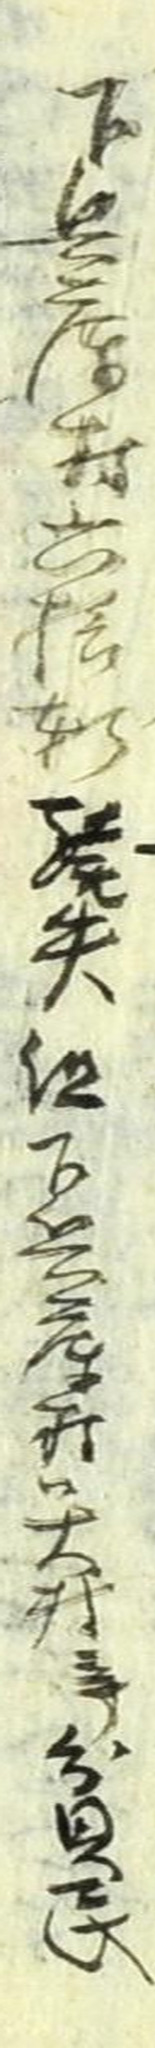下兵庫村六拾軒焼失但下兵庫村ハ大村ニテ貧民
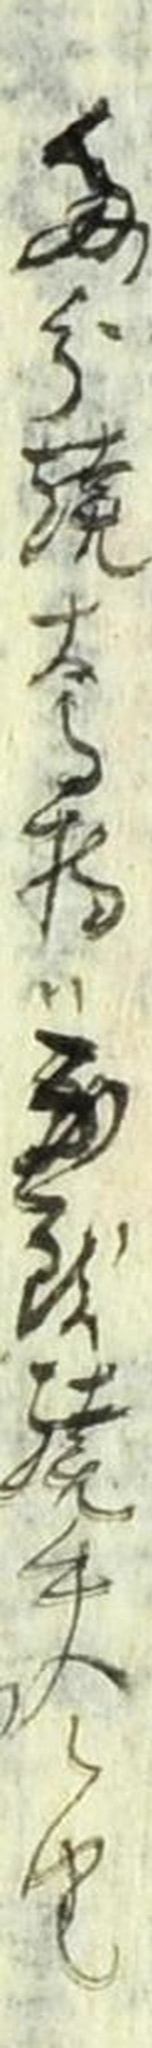多分焼たる物ハ不致焼失候由
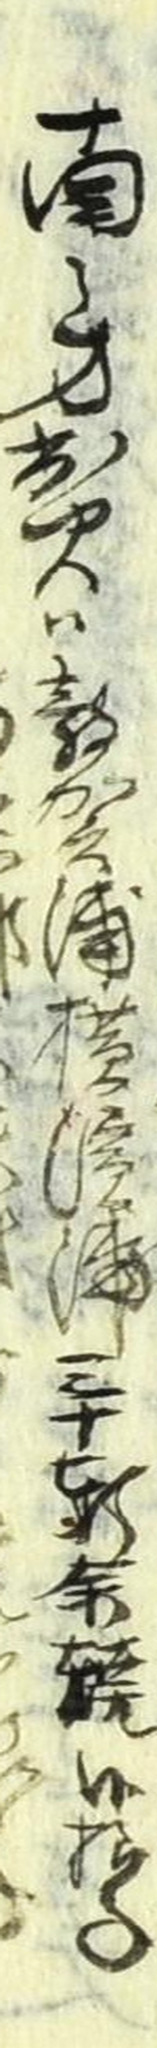南之方出火ハ敦賀浦横浜浦三十軒余焼候様子
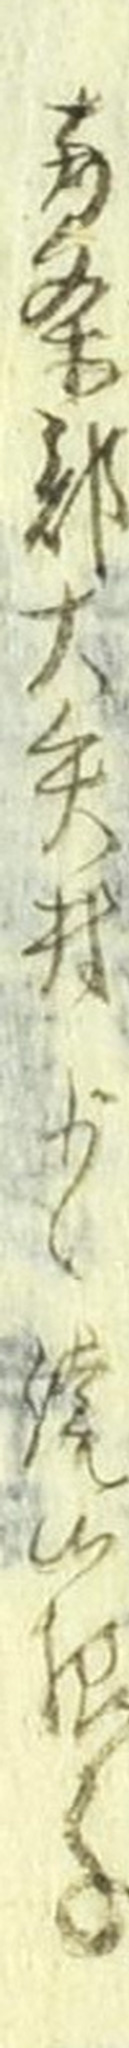南条郡大矢村少々焼候様子
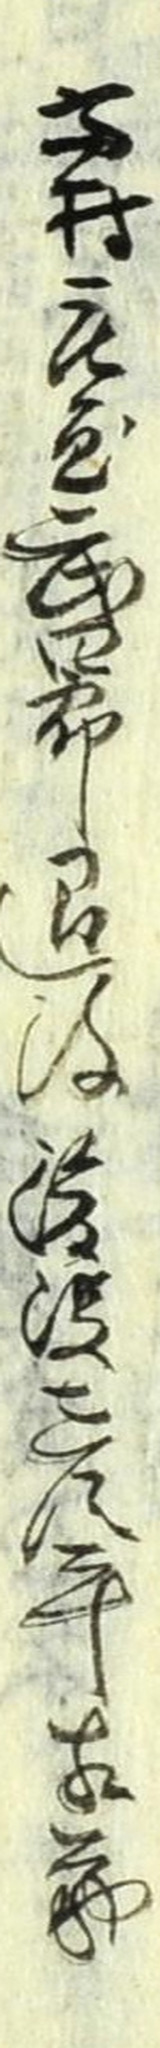当村庄屋武四郎退役後役彦平相勤
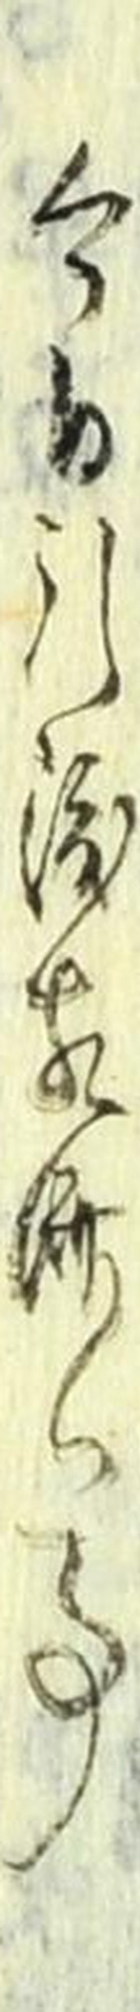今日引渡相済候事
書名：（日記）
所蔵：福井県文書館 Fukui Prefectural Archives
